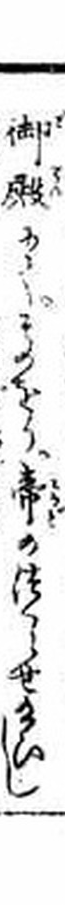御殿にてそのをり帝のつくらせ給ひし
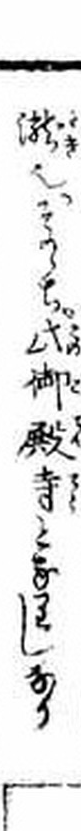瀧也そのゝち此御殿寺となりしなり任

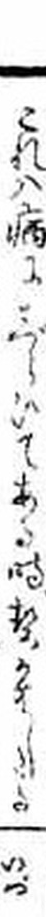これは病にわづらひてある時契かはしける
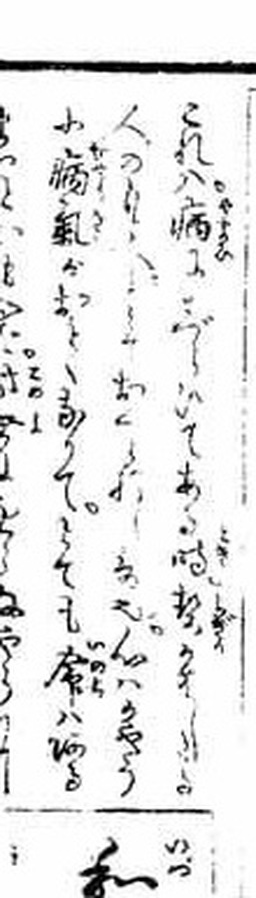人のもとにおくられし哥也心はかやう和
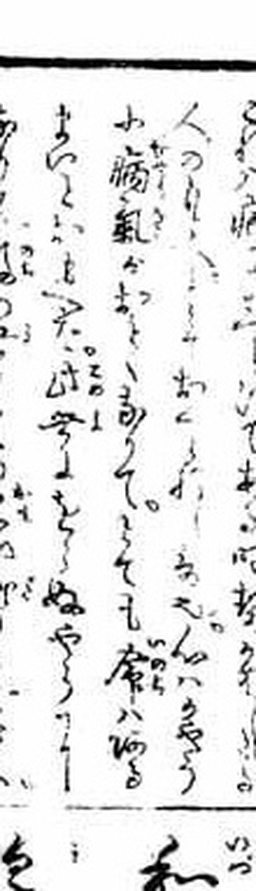に病氣かおもくなりてとても命はある
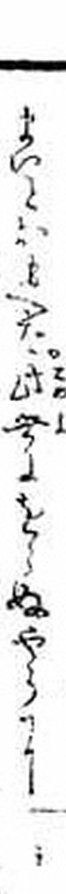まいとおもへば此世にをらぬやうに泉
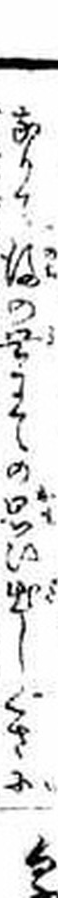なりて後の世にて思ひ出しぐさに
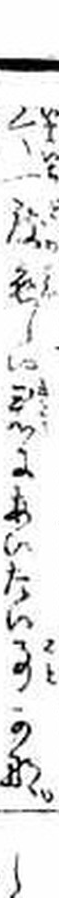今一度恋しい君にあひたい事かな
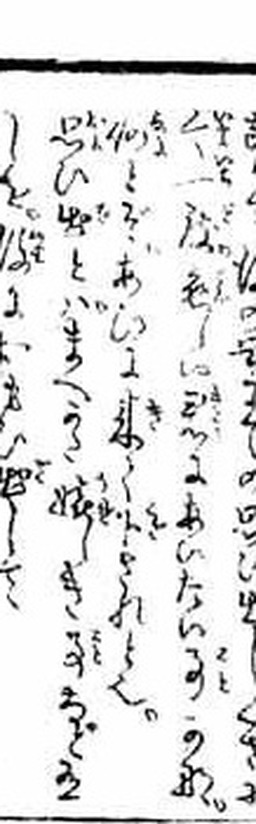何とぞあひに来て下されと也式
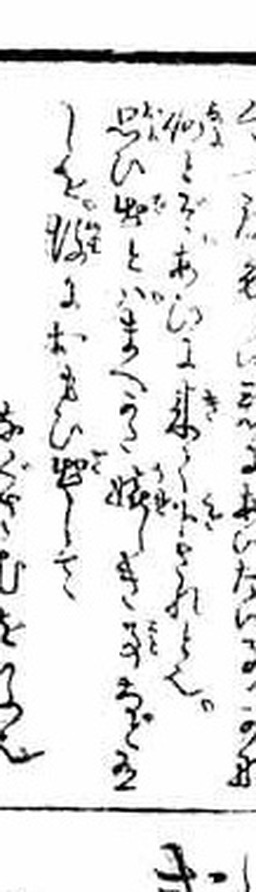思ひ出とはまへかた嬉しき事など有
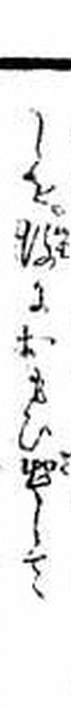しを後におもひ出して
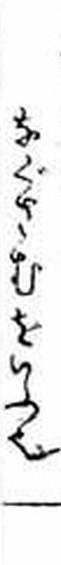なぐさむをいふ也部
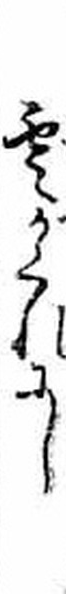雲がくれにし
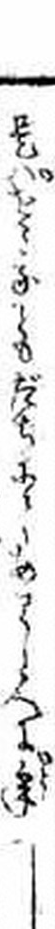是はををみなともだちにてありし人に
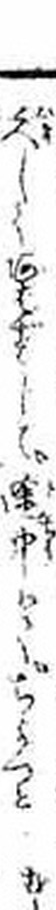久しく逢はずして途中にちよつと
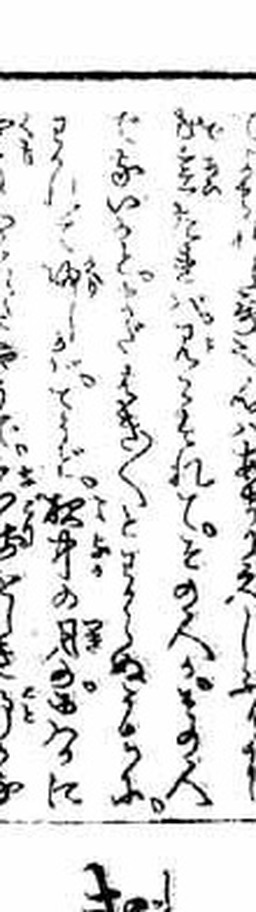でないかとまたはき〳〵とわからぬうちに式
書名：小倉百人一首
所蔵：東京学芸大学教育コンテンツアーカイブ
